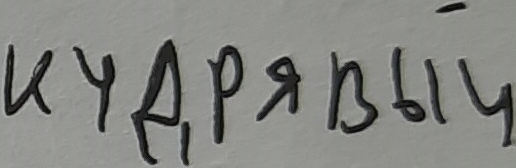кудрявый
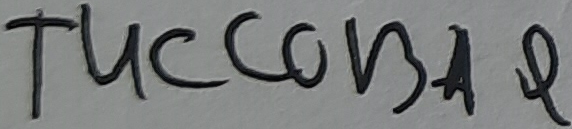тиссовая
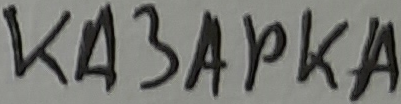казарка
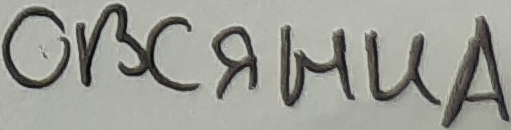овсянка
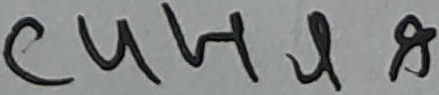синяя
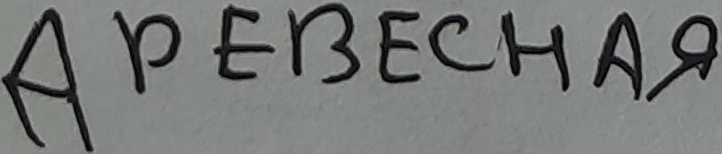древесная
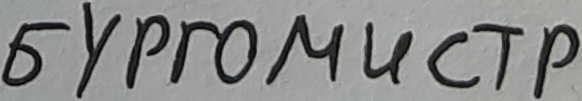бургомистр
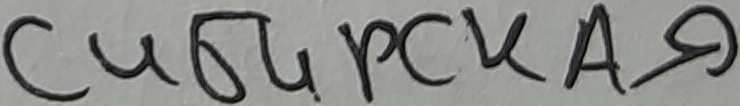сибирская
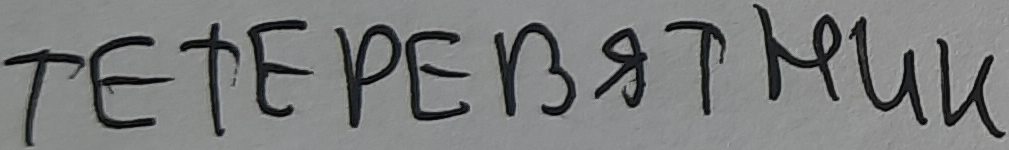тетеревятник
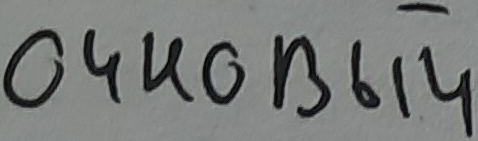очковый
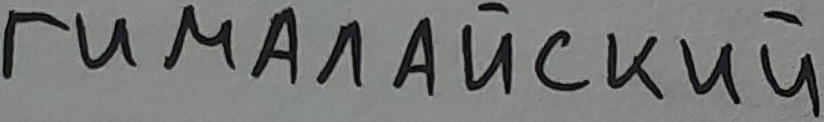гималайский
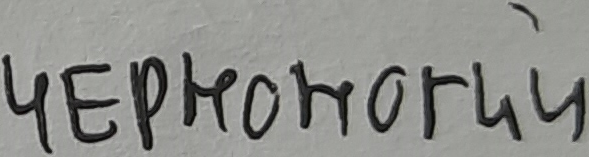черноногий
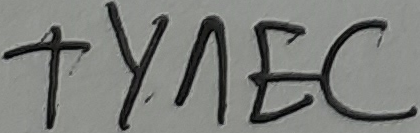тулес
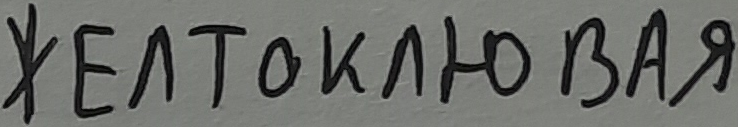желтоклювая
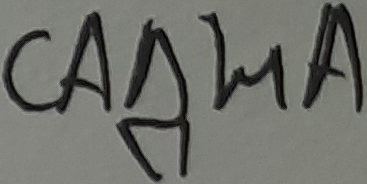саджа
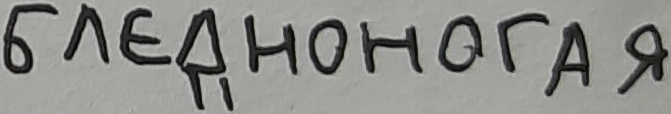бледноногая
